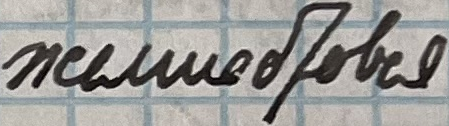желтобровая
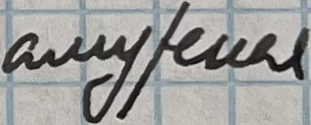амурская
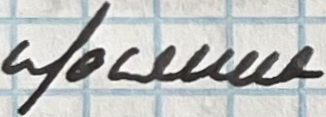просянка
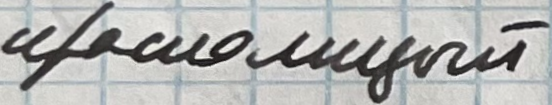краснолицый
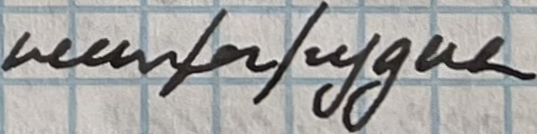пестрогрудка
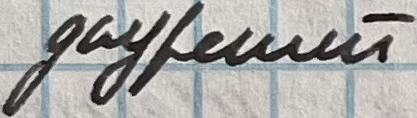даурский
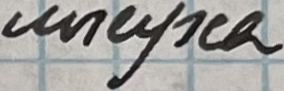лысуха
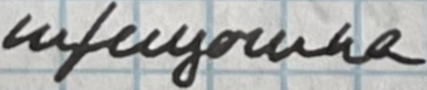трещотка
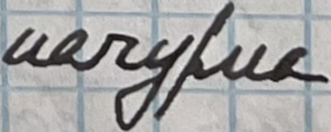качурка
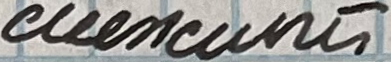снежный
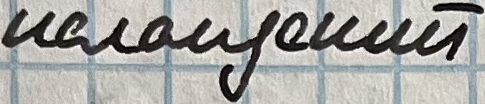исландский
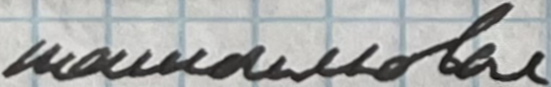тонкоклювая
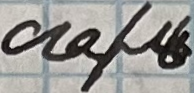огарь
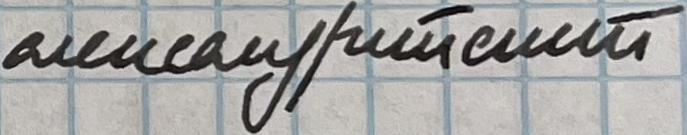александрийский
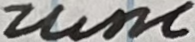чиж
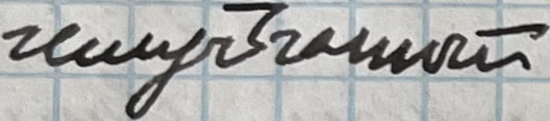чешуйчатый
